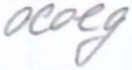осоед
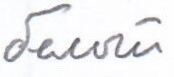белый
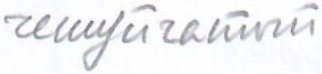чешуйчатый
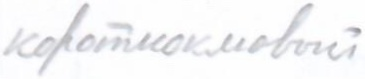короткоклювый
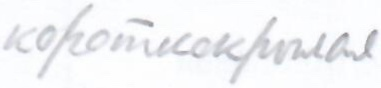короткокрылая
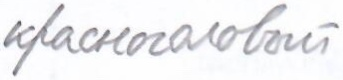красноголовый
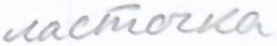ласточка
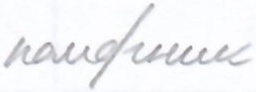поморник
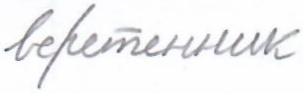веретенник
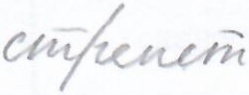стрепет
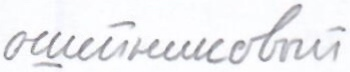ошейниковый
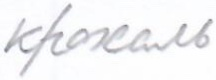крохаль
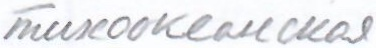тихоокеанская
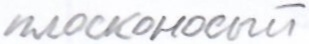плосконосый
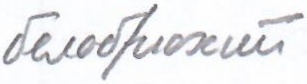белобрюхий
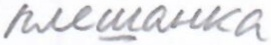плешанка
